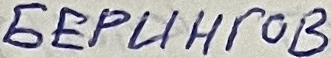берингов
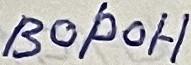ворон
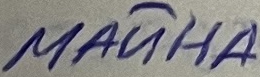майна
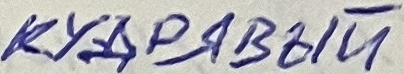кудрявый
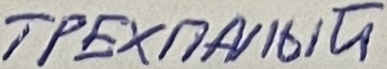трехпалый
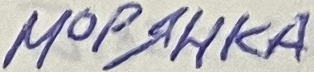морянка
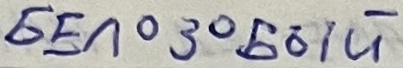белозобый
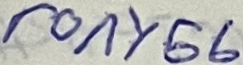голубь
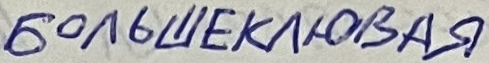большеклювая
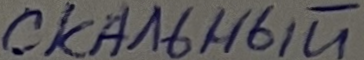скальный
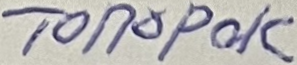топорок
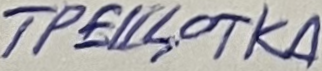трещотка
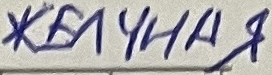желчная
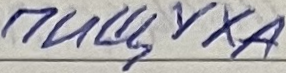пищуха
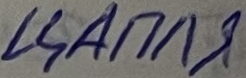цапля
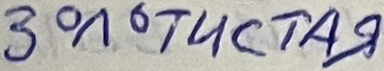золотистая
